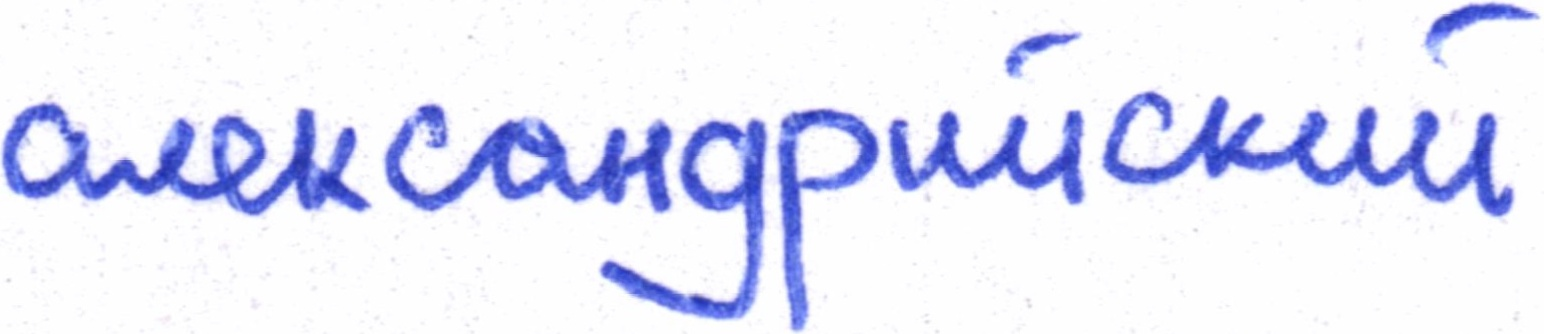александрийский
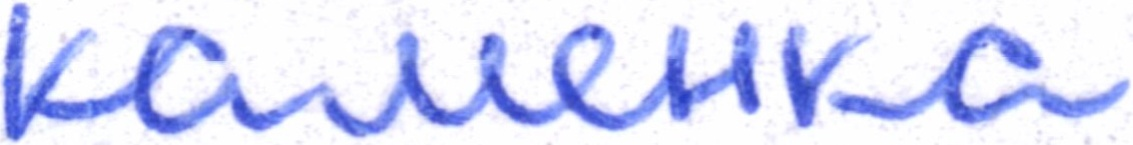каменка
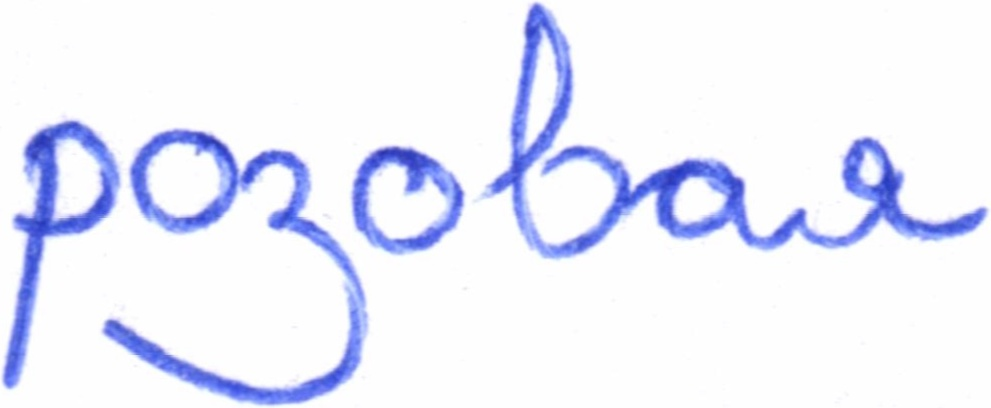розовая
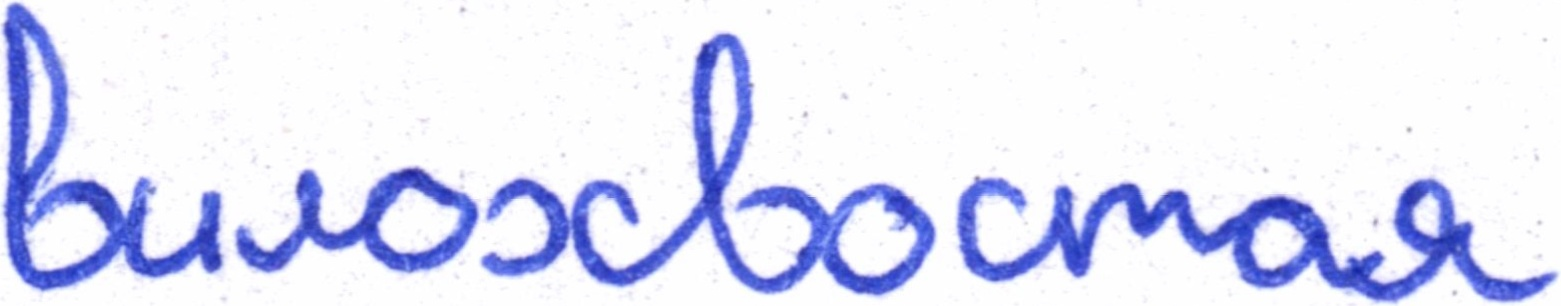вилохвостая
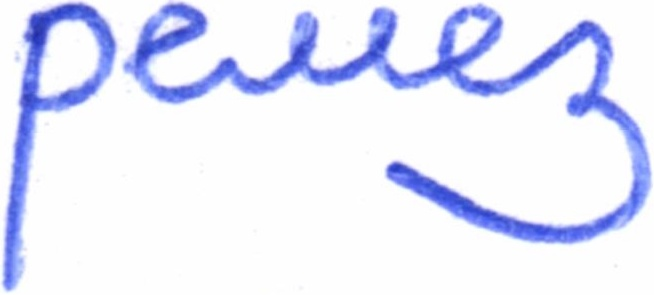ремез
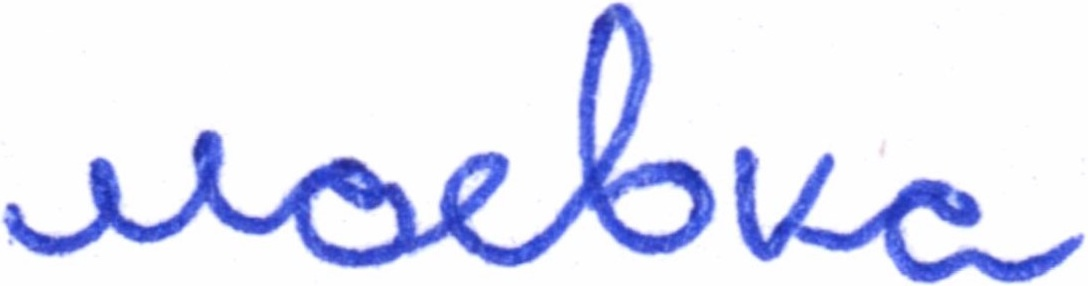моевка
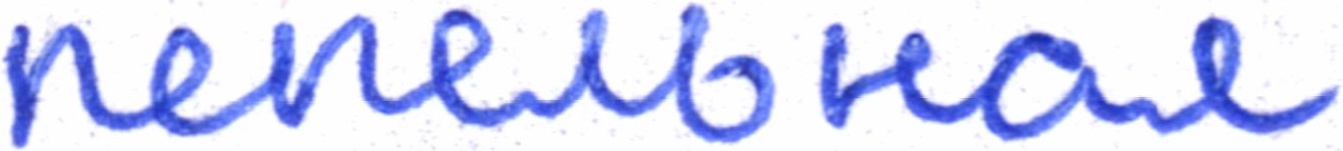пепельная
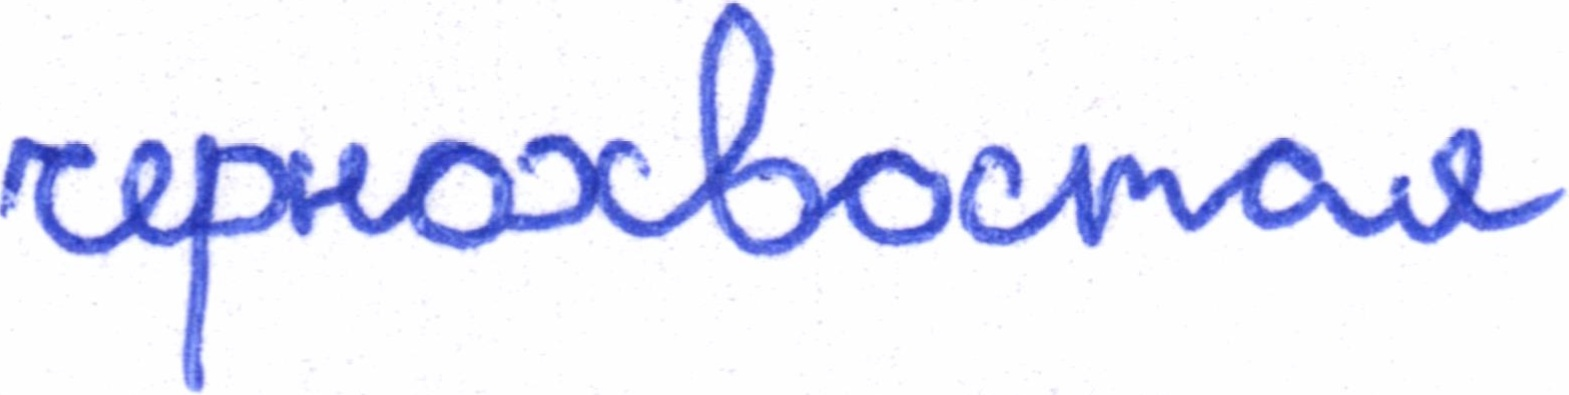чернохвостая
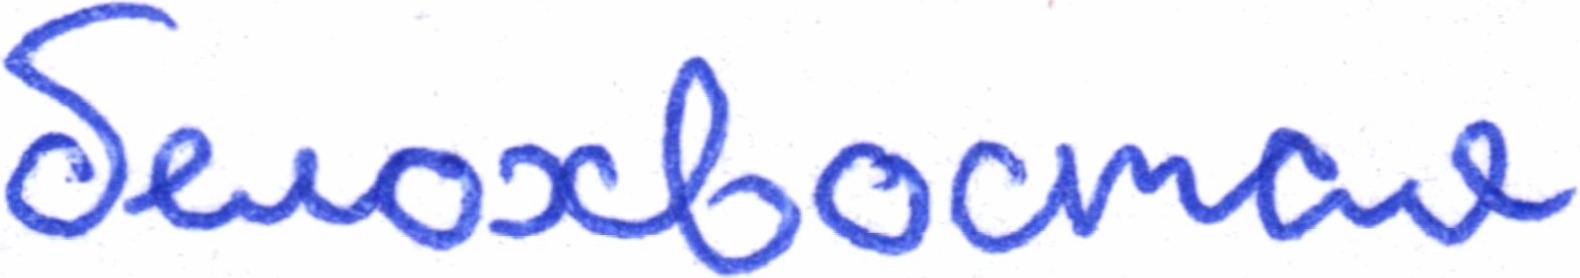белохвостая
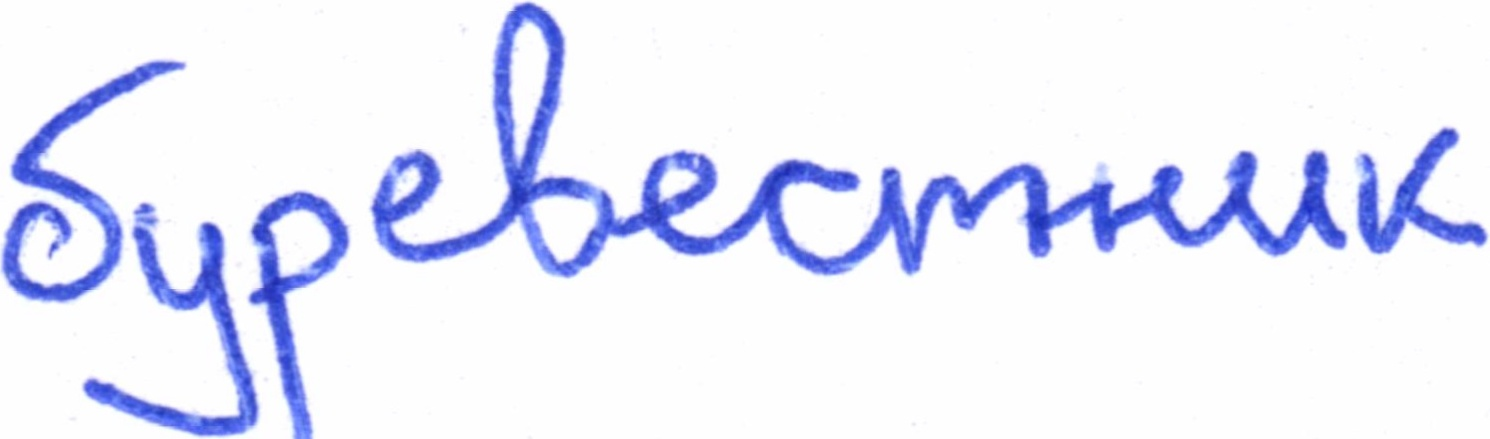буревестник
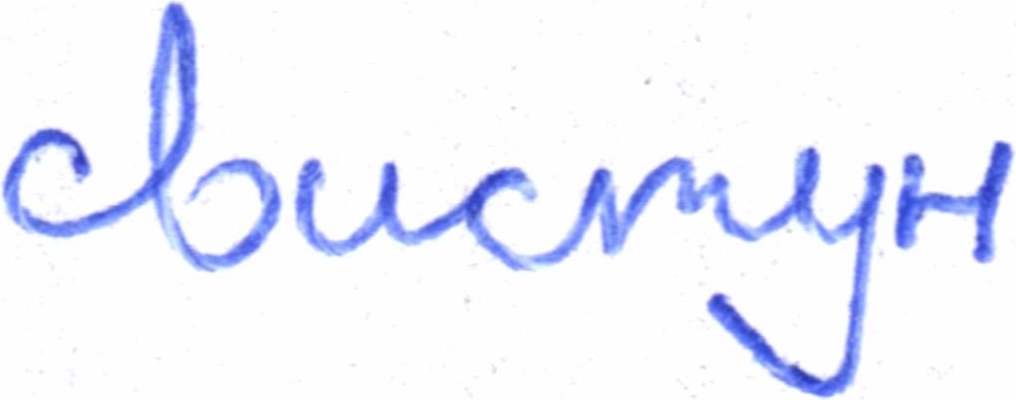свистун
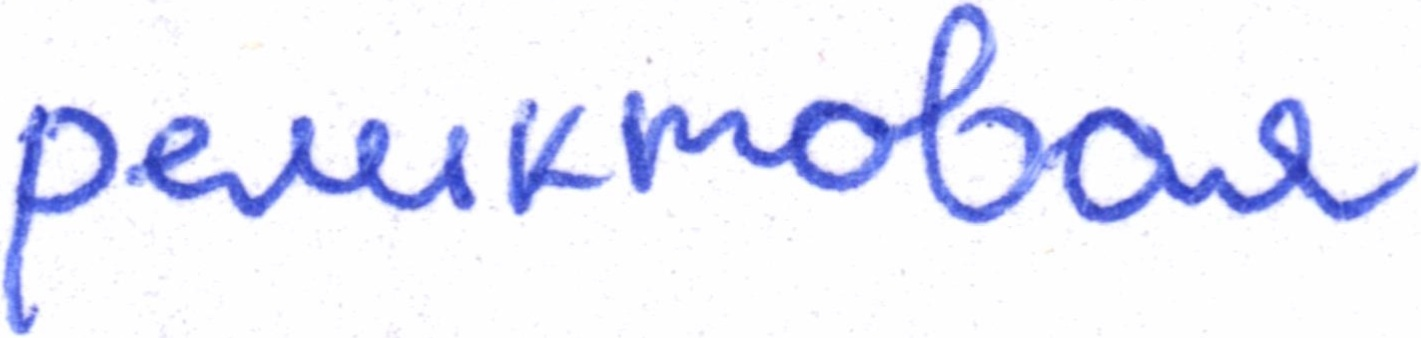реликтовая
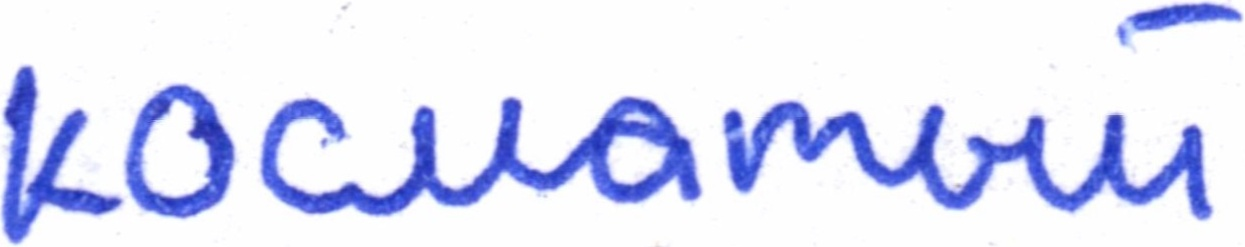косматый
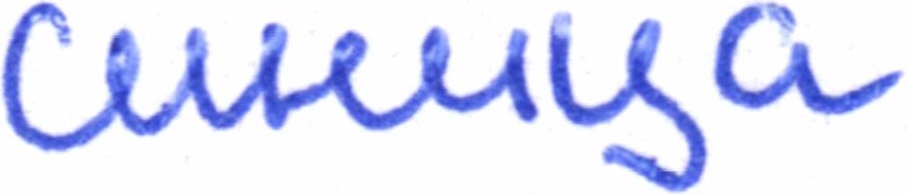синица
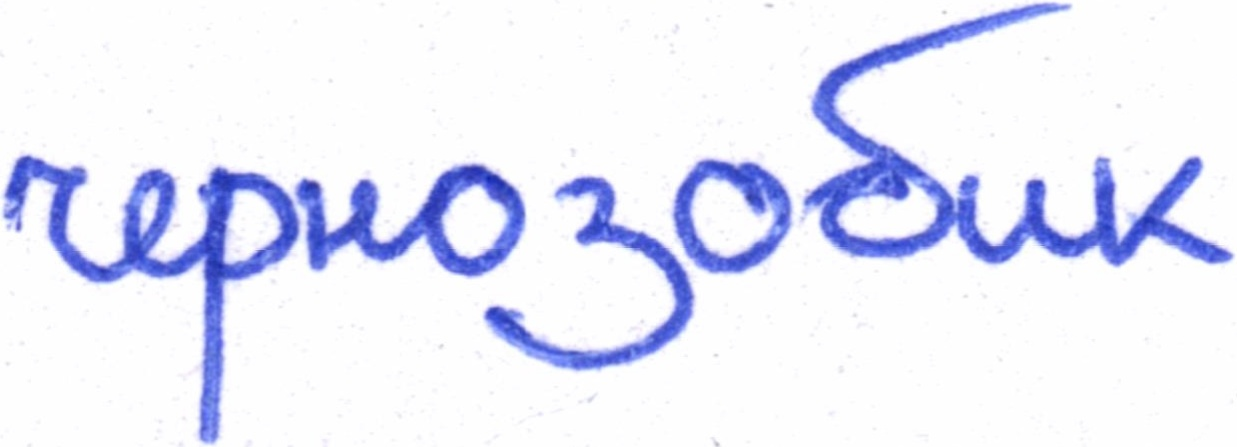чернозобик
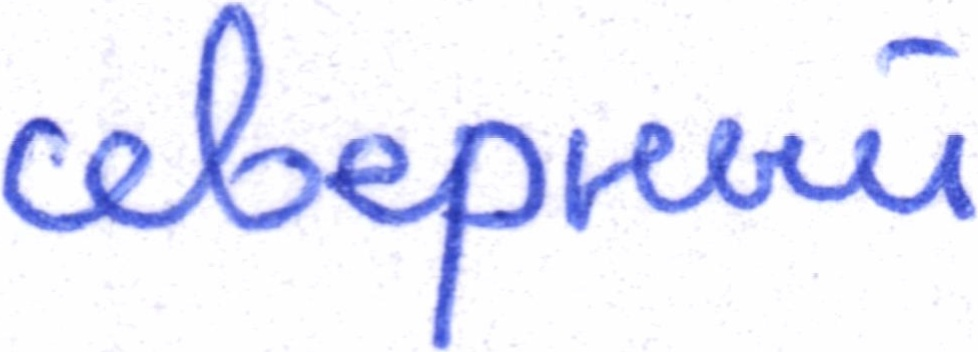северный
